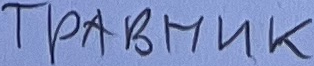травник
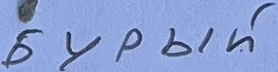бурый
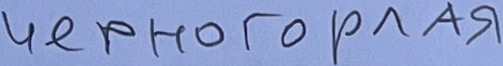черногорлая
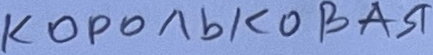корольковая
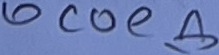осоед
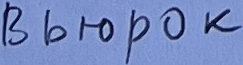вьюрок
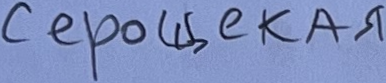серощекая
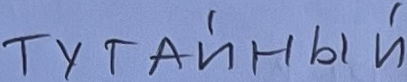тугайный
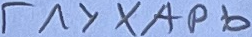глухарь
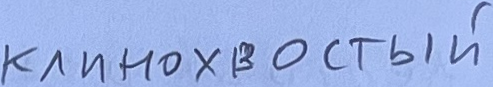клинохвостый
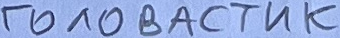головастик
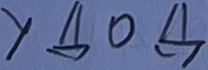удод
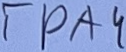грач
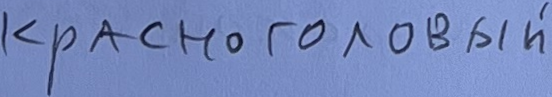красноголовый
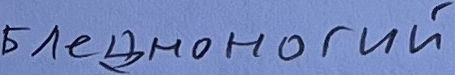бледноногий
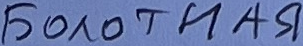болотная
